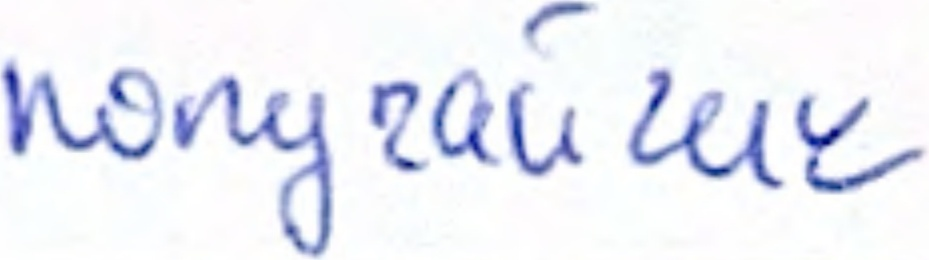попугайчич
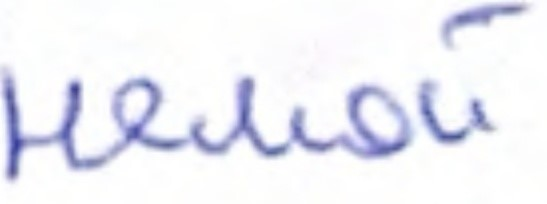немой
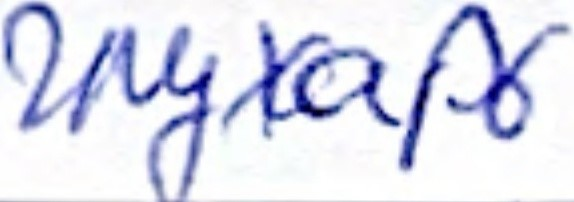глухарь
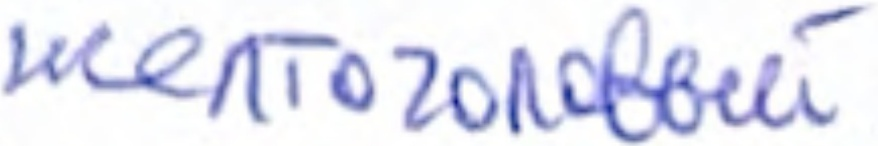желтоголовый
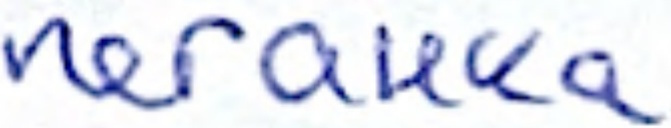пеганка
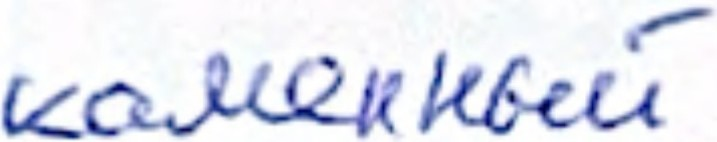каменный
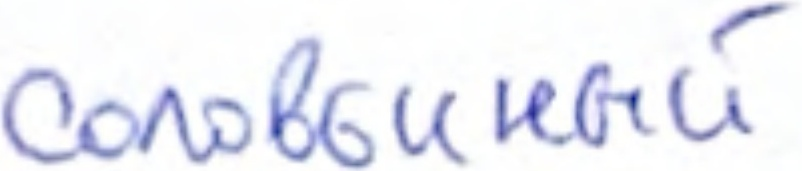соловьиный
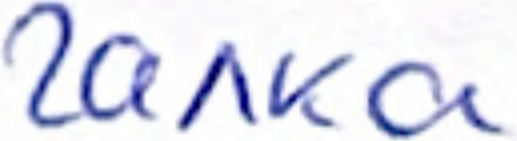галка
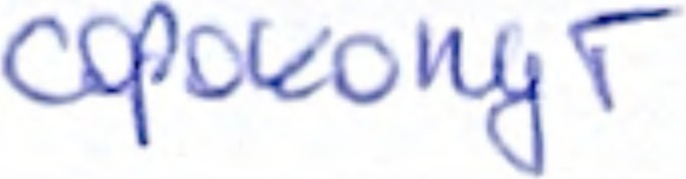сорокопут
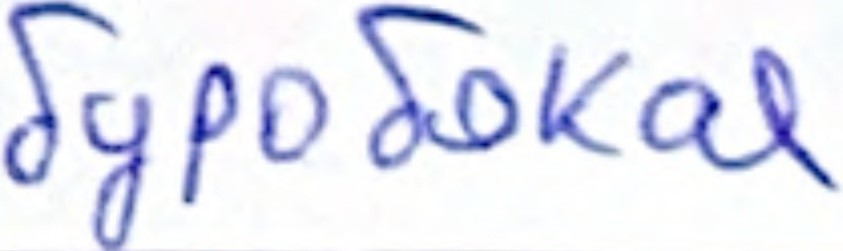буробокая
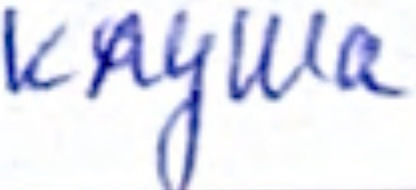клуша
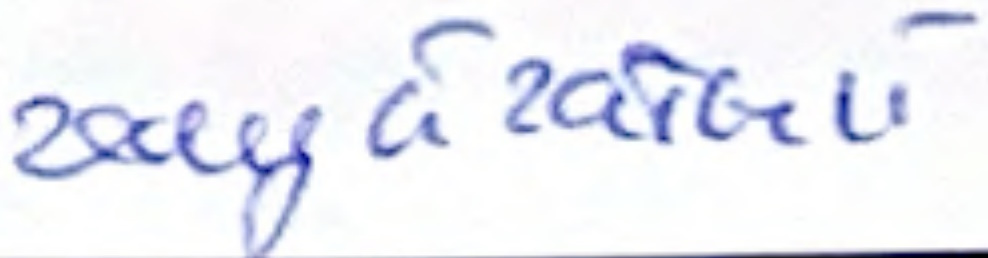чешуйчатый
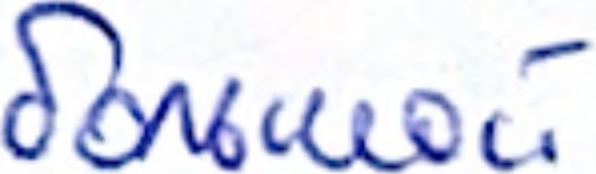большой
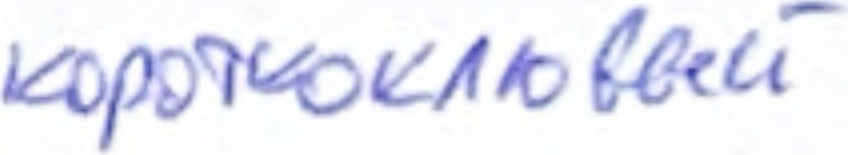короткоклювый
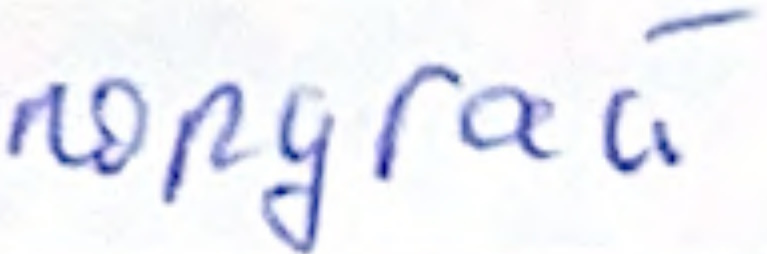попугай
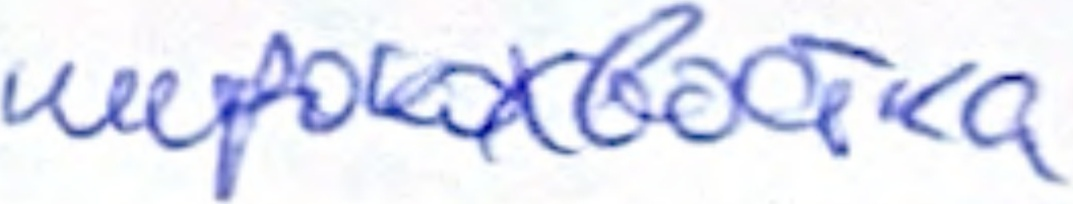широкохвостка
